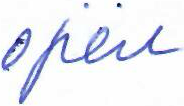орёл
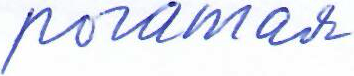рогатая
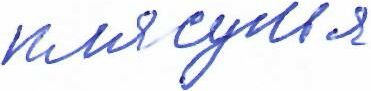плясунья
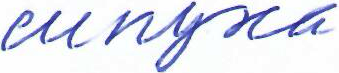сипуха
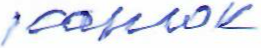канюк
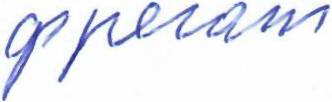фрегат
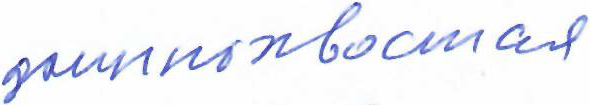длиннохвостая
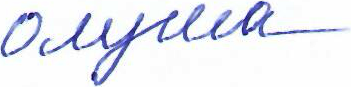олуша
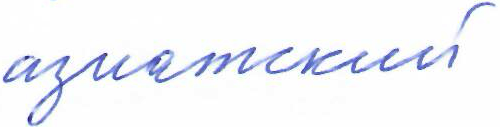азиатский
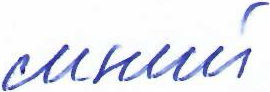синий
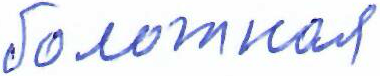болотная
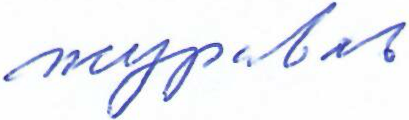журавль
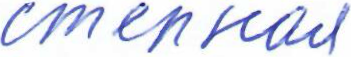степная
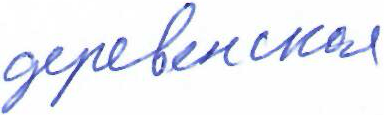деревенская
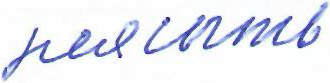неясыть
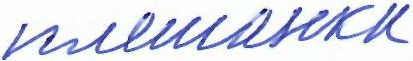плешанка
